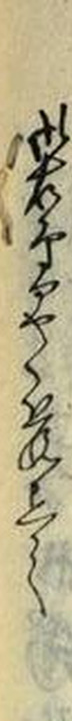御右筆部屋へ恐悦申上之
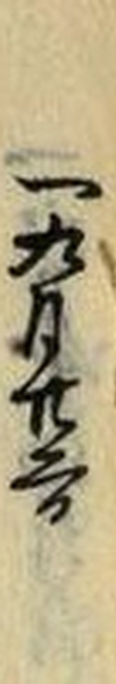一九月廿二日
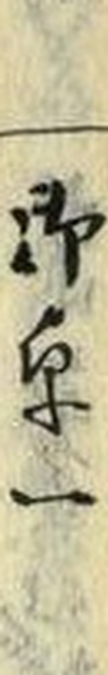御卓一
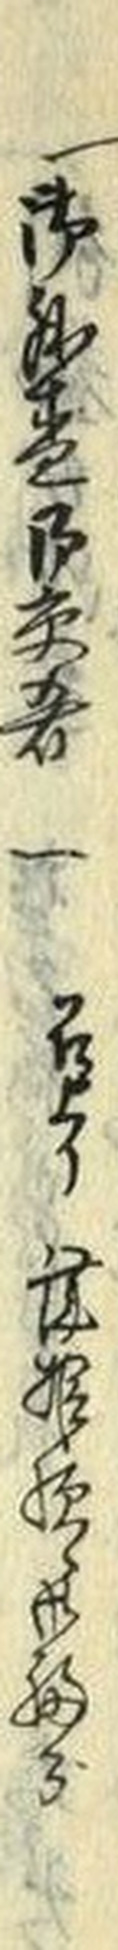御鉢盛御交肴一召上り謹姫様へ御福分
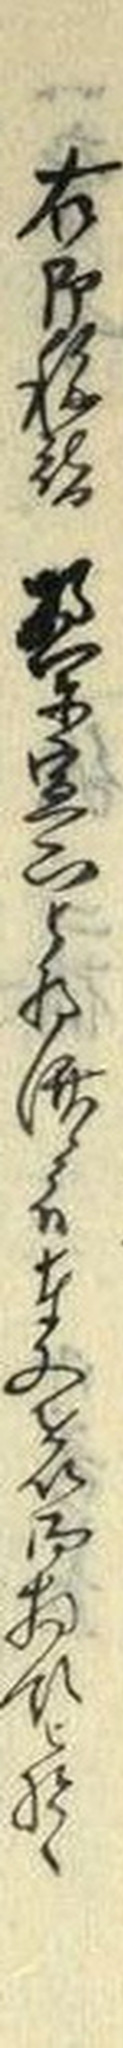右御移替将軍宣下被為済候ニ付奉文を以御拝領被遊候
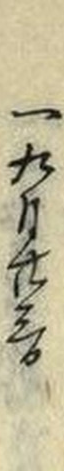一九月廿二日
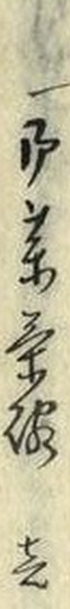御薬茶碗壱
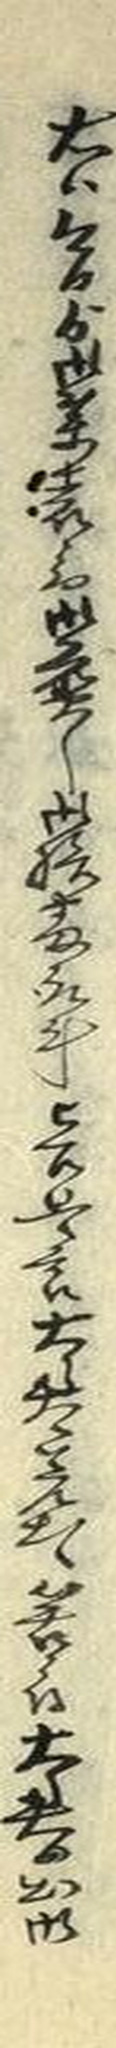右ハ今日ゟ御薬表ニ而御煎し御膳番取計被召上候節大奥差出候筈ニ付大奥ゟ出御
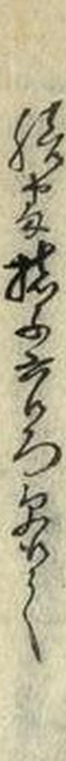膳番猪子六左衛門受取之
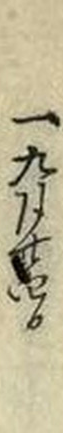一九月廿二日
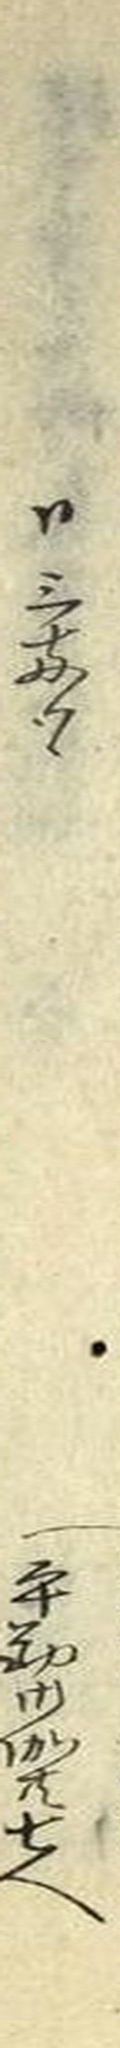同三両ツヽ平勤御伽共七人
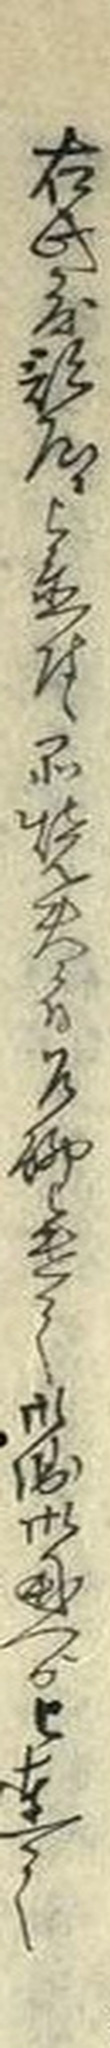右此度部屋ニ被置付候品焼失ニ付乍聊被遣之御側御用人被達之
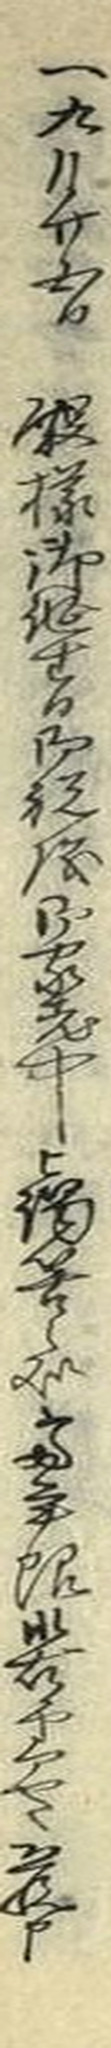一九月廿五日殿様御誕生日御祝儀御家老中被謁筈之処当年限御右筆部屋へ恐悦申
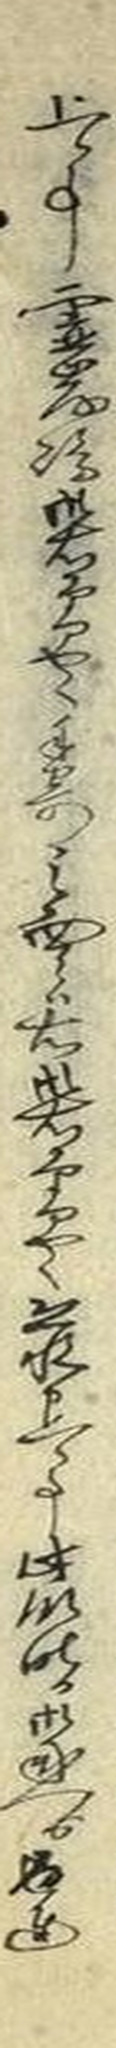上候事霊厳嶋御右筆部屋へ手寄之面々ハ右御右筆部屋へ恐悦申上候事此段昨日御用人ゟ通達
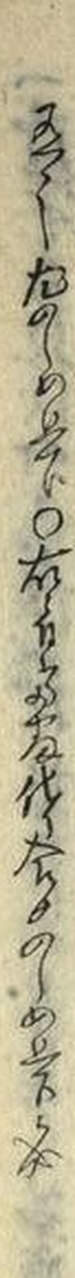有之尤のしめ上下〇右ニ付当番代り合ものしめ上下ニ成

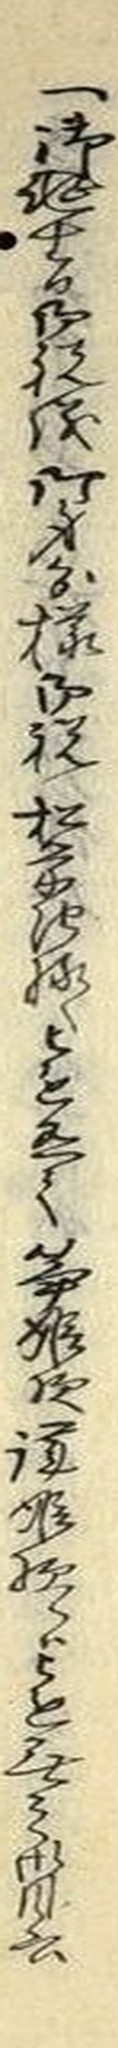一御誕生日御祝儀御見分様御祝松栄院様へ被進有之箏姫様謹姫様ヘハ被進無之御目六
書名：少傅日録抄（斉善付側向頭取日記、在府）
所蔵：福井県文書館 Fukui Prefectural Archives
